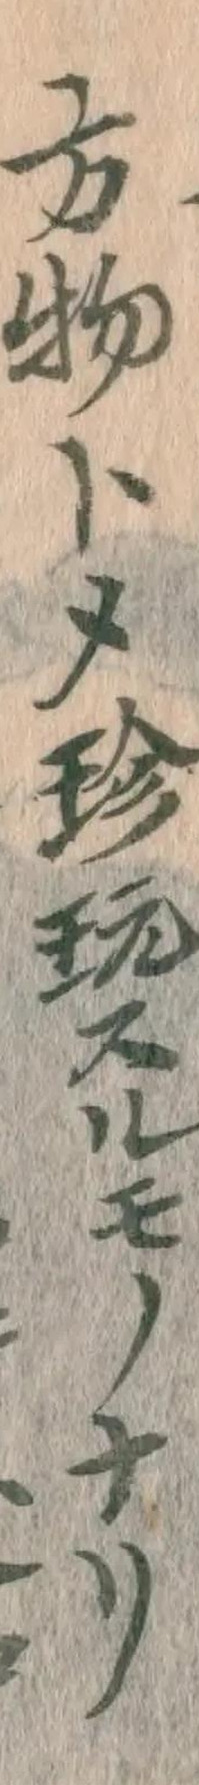方物トシテ珍玩スルモノナリ
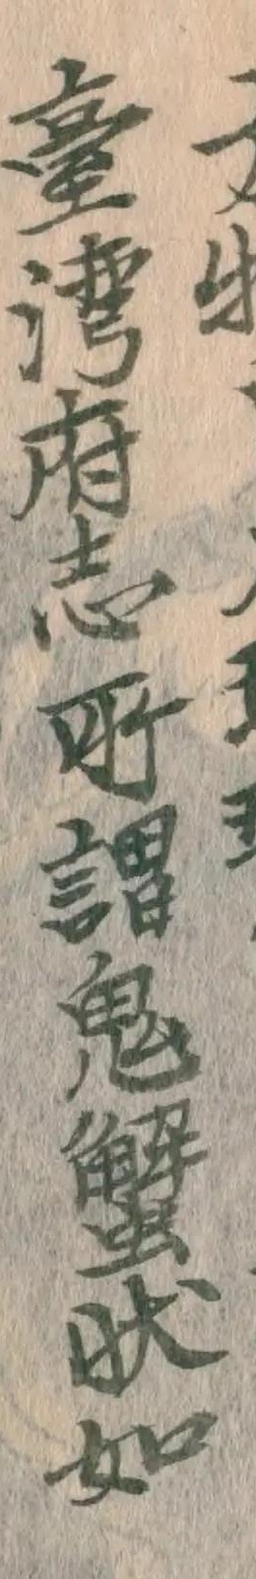台湾府志所謂鬼蟹状如
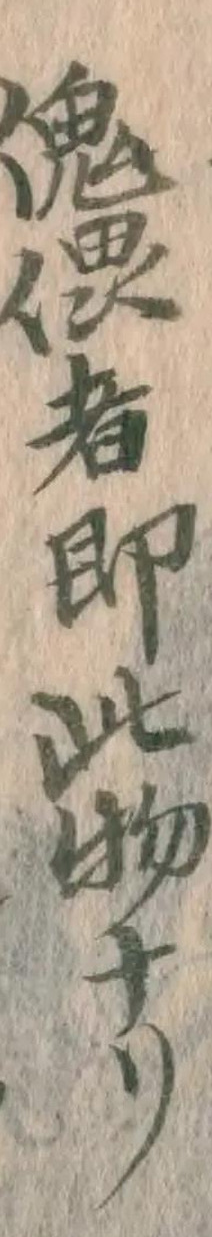傀儡者即此物ナリ
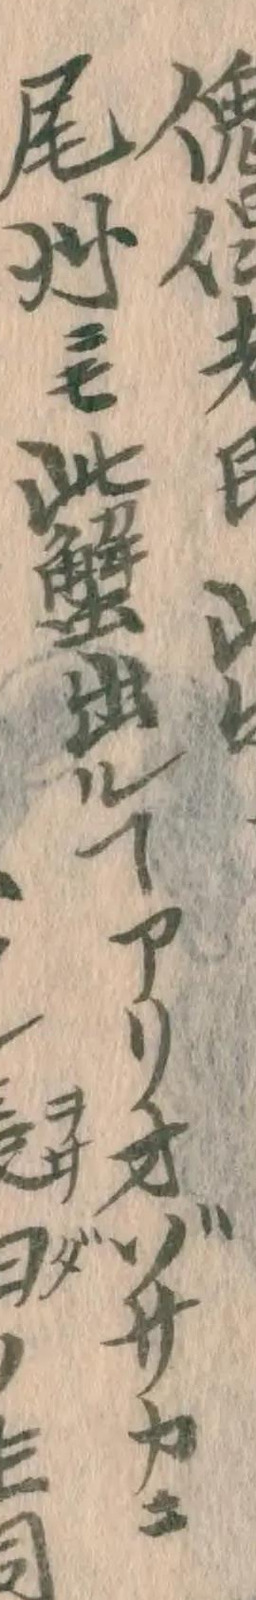尾州ニモ此蟹出ルコトアリオゾサカニ
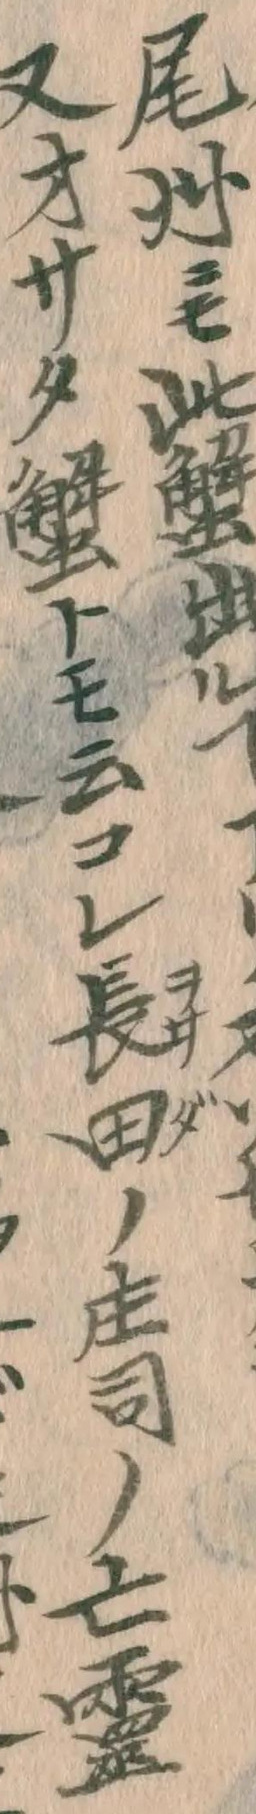又オサタ蟹トモ云コレ長田ノ庄司ノ亡霊
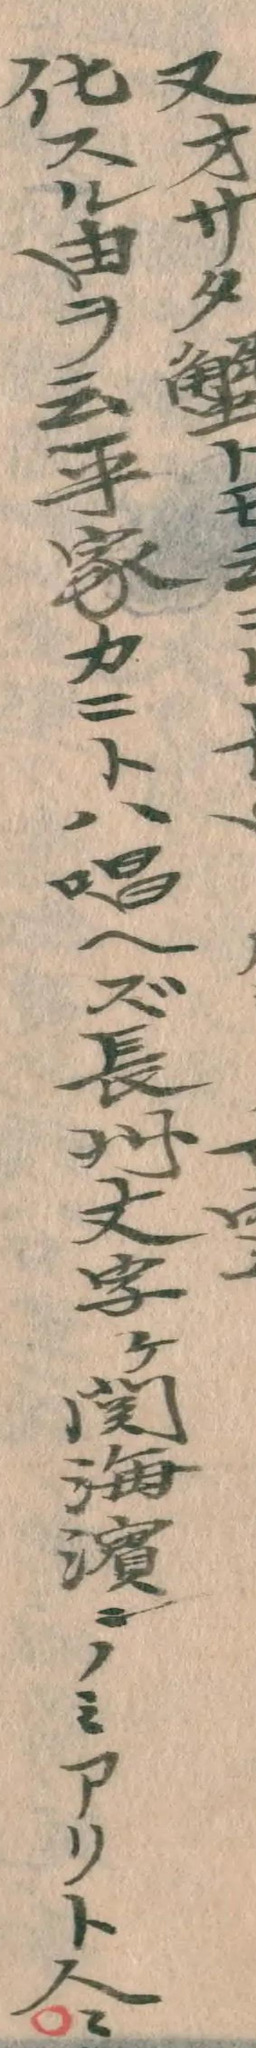化スル由ヲ云平家カニトハ唱ヘズ長州文字ヶ関海濱ニノミアリト人々○
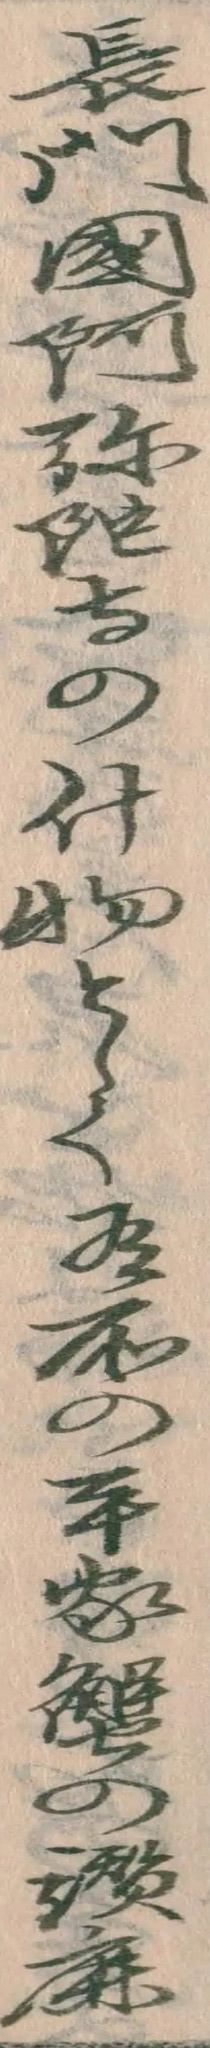長門国阿弥陀寺の什物として有所の平家蟹の讃廉
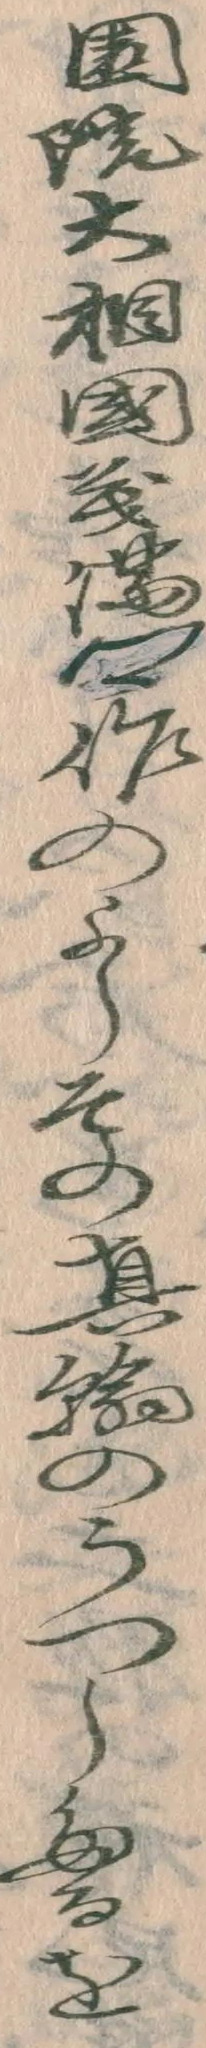国院大相国義満卿作のよしその真翰のうつしたるを
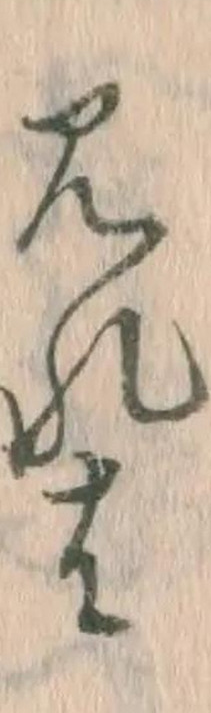みれは
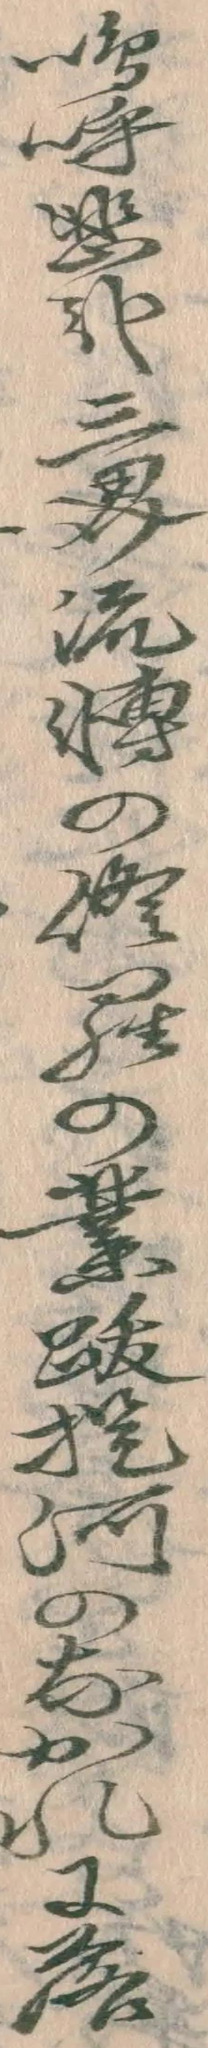嗚呼悲哉三界流転の修羅の業跋提河のなかれに落
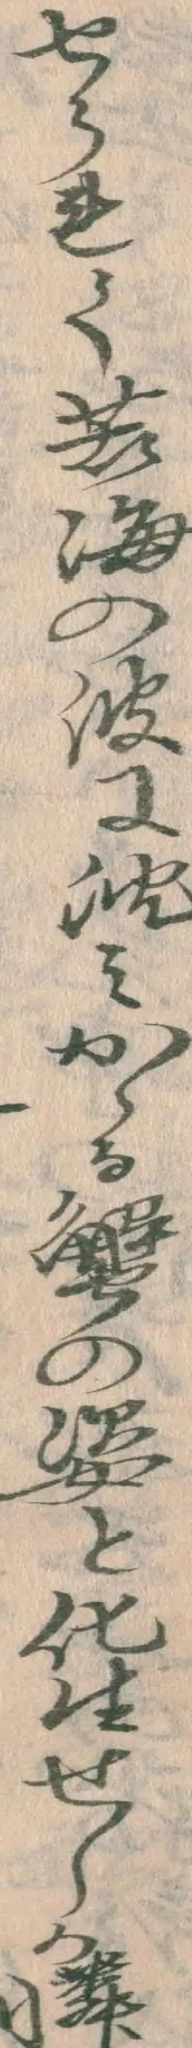せられて苦海の波に沈みかかる蟹の姿と化生せしか憐
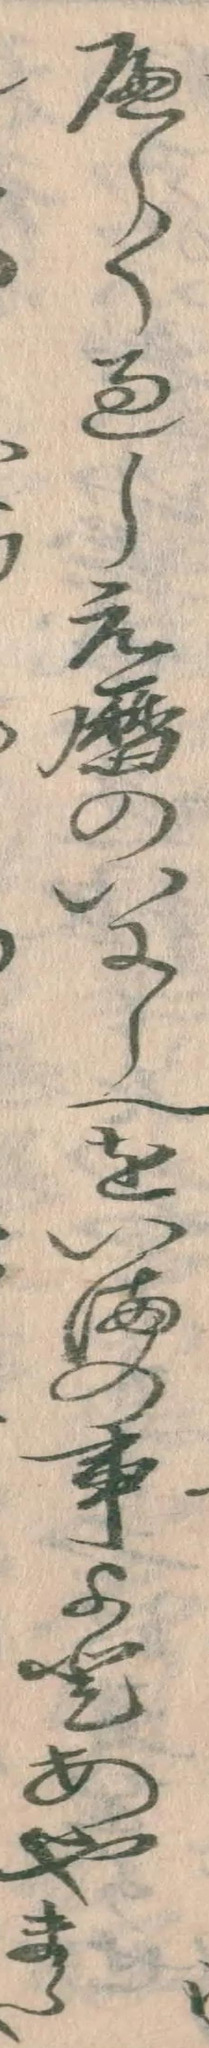へし〳〵過し元暦のいにしへをいまの事よとあやまた
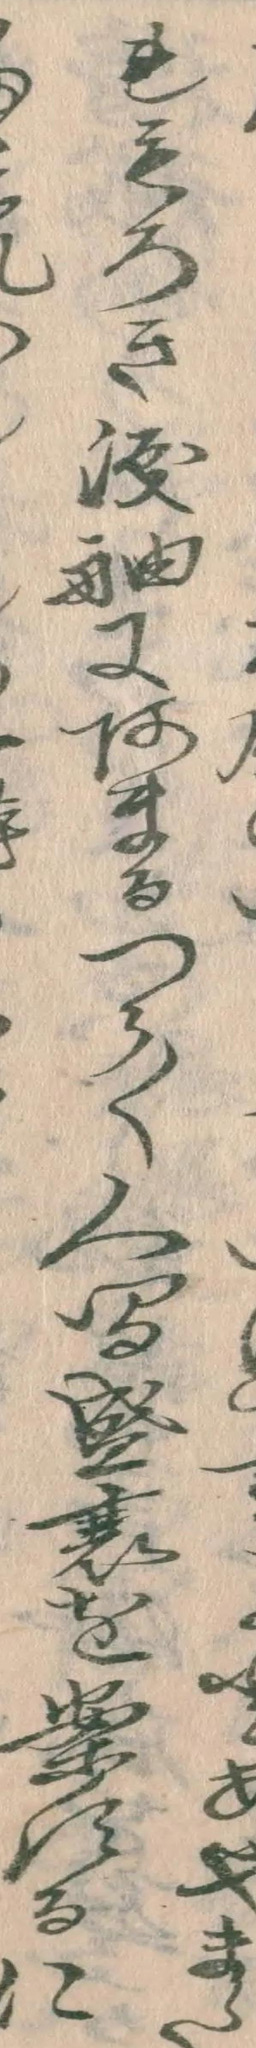れもろき涙袖にあまるつら〳〵人間盛衰を案するに
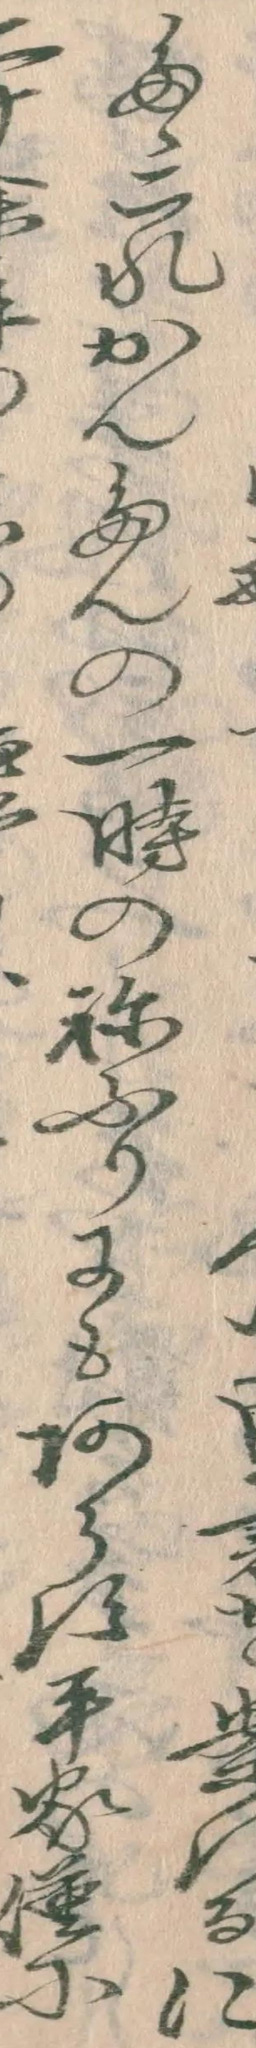たゝこれかんたんの一時のねふりにもあらす平家僅に
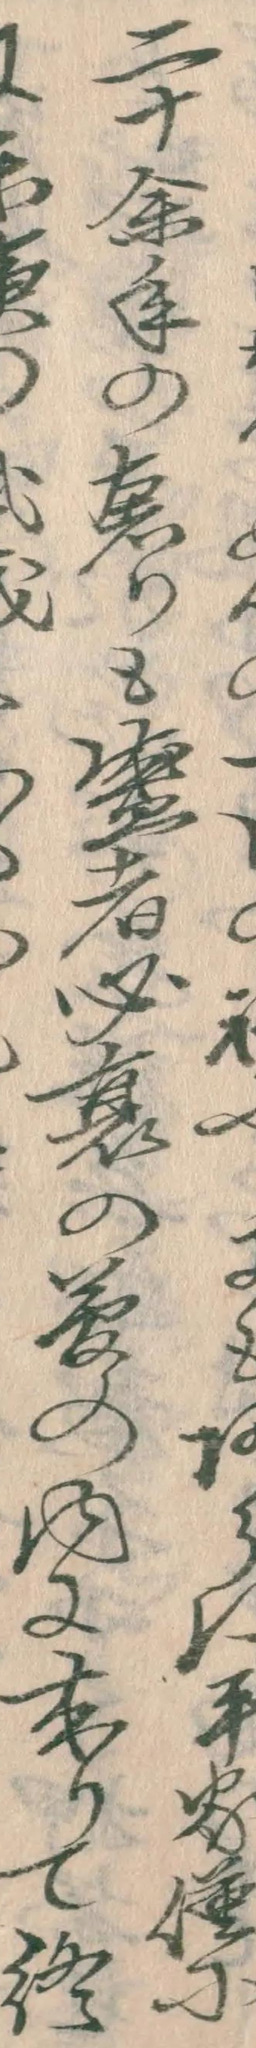二十余年の奢りも盛者必衰の夢の内に来りて終
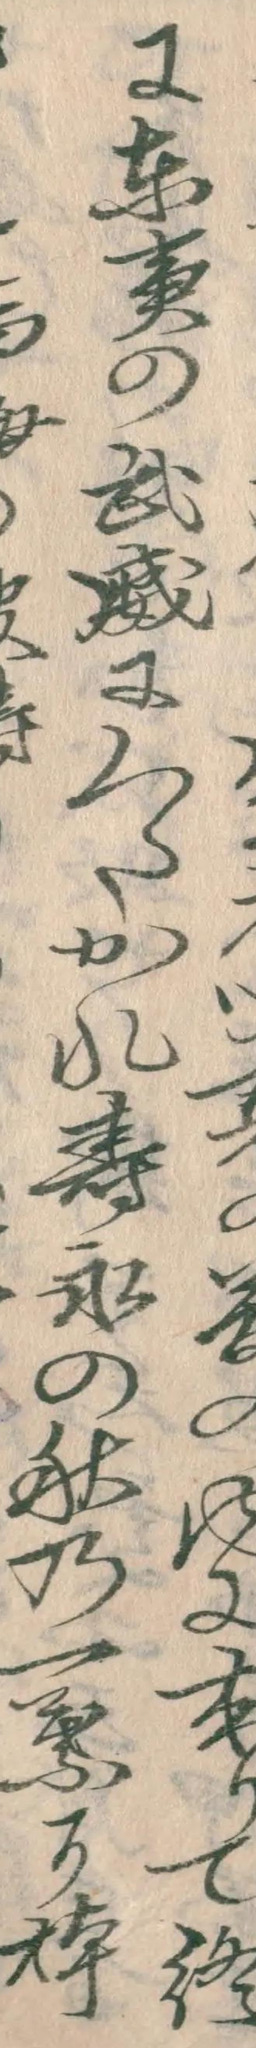に東夷の武威にくたかれ寿永秋の一葉に棹
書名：千蟲譜 3巻. [3]
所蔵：国立国会図書館 National Diet Library, JAPAN
